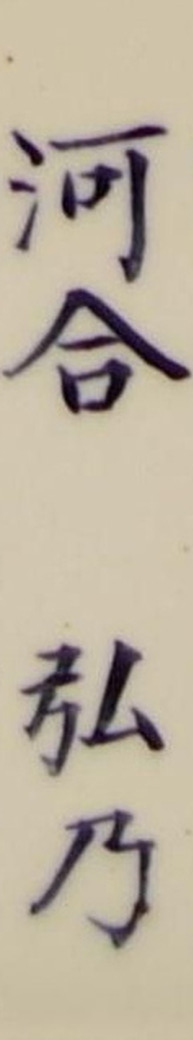河合弘乃
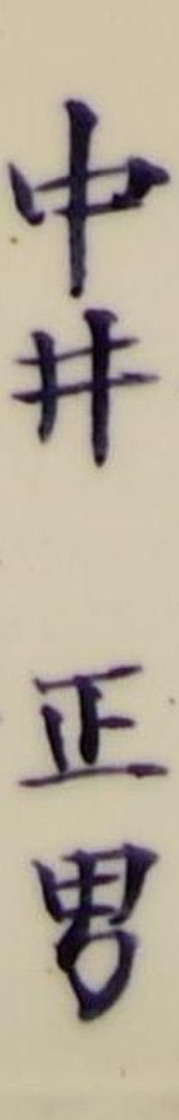中井正男
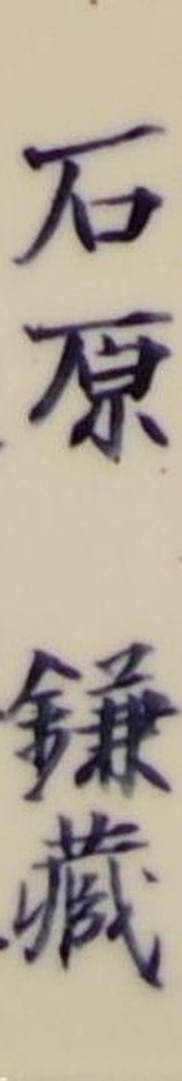石原鎌蔵
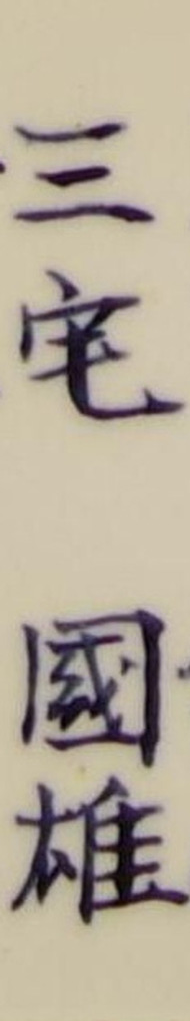三宅国雄
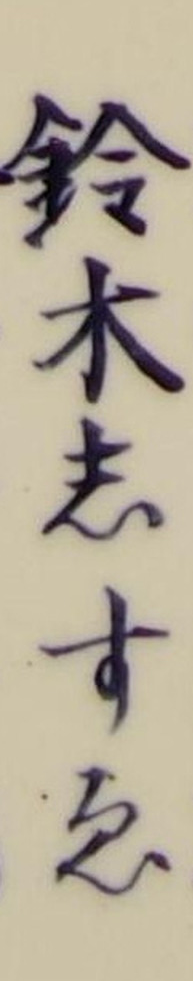鈴木しすゑ
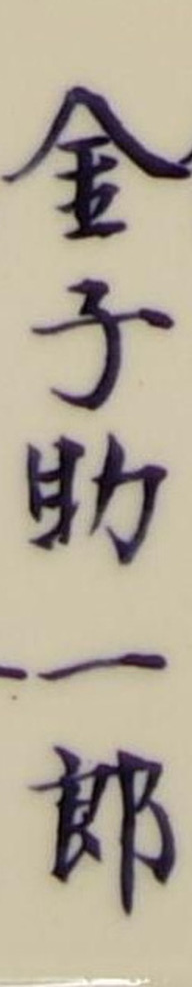金子助一郎
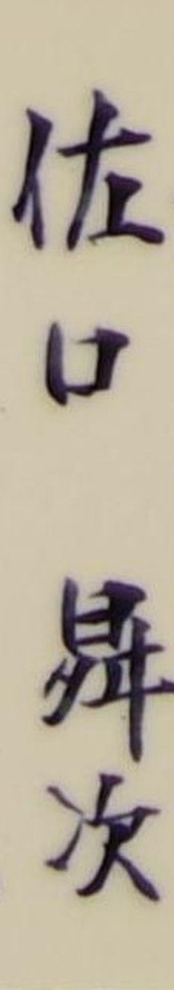佐口昇次
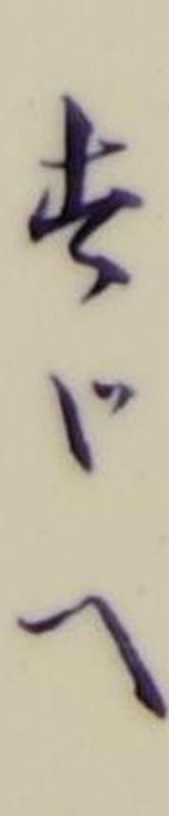すゞへ
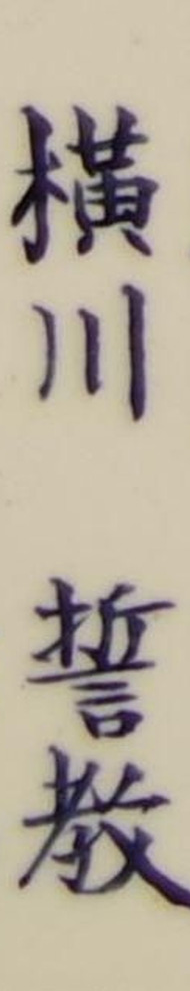横川誓教
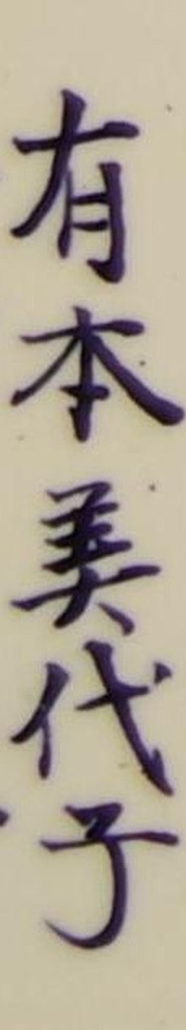有本美代子
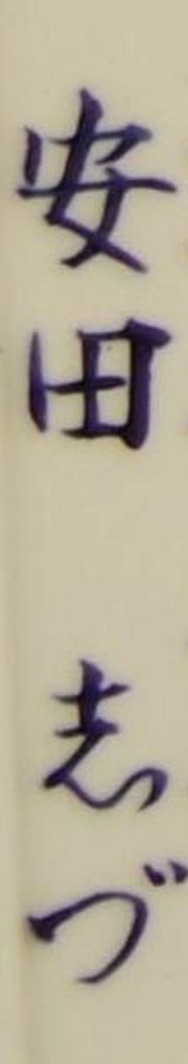安田しづ

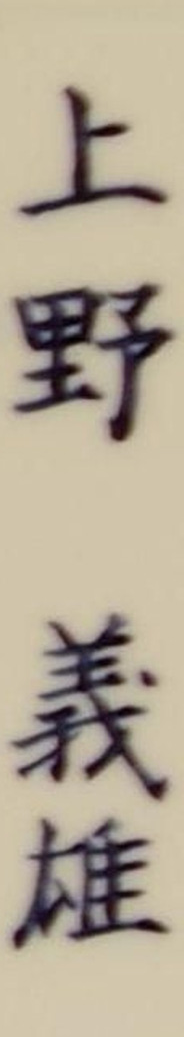上野義雄
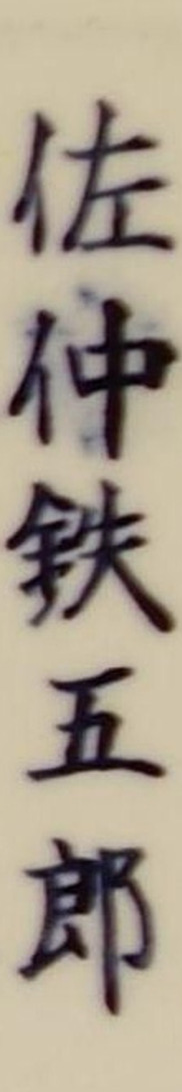佐仲鉄五郎
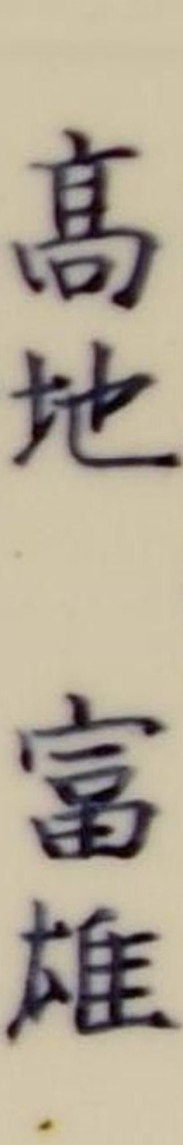高地富雄
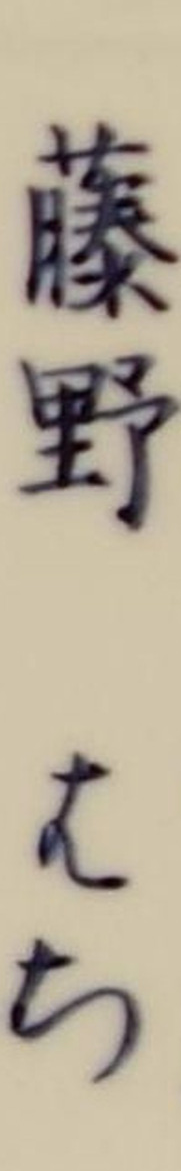藤野はち
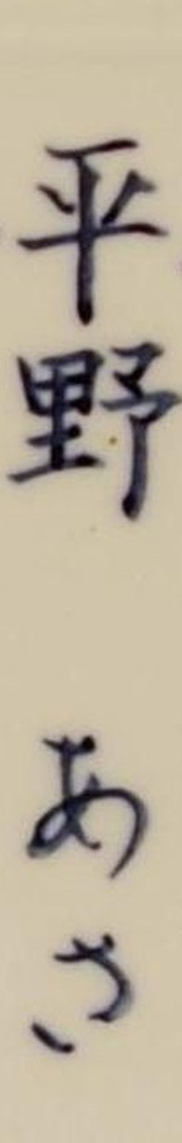平野あさ
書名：E~L
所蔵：高野山金剛峯寺
